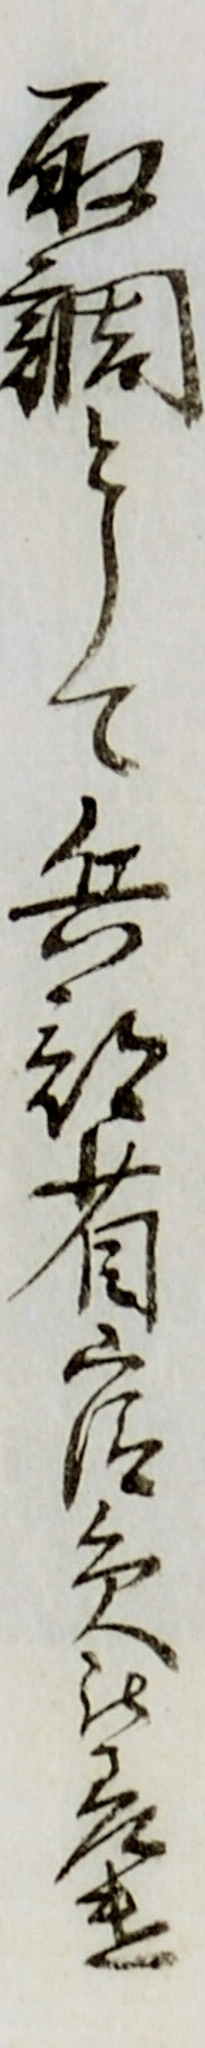取調として兵部省官員被差遣
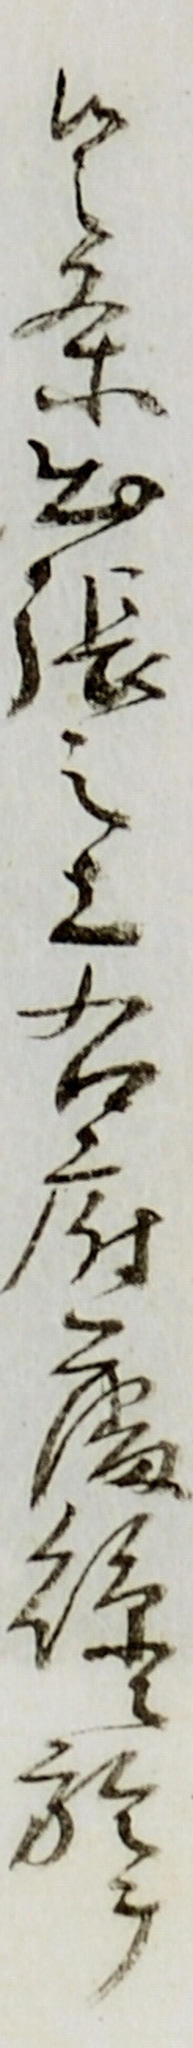候之条出張之上右府藩県に於テ
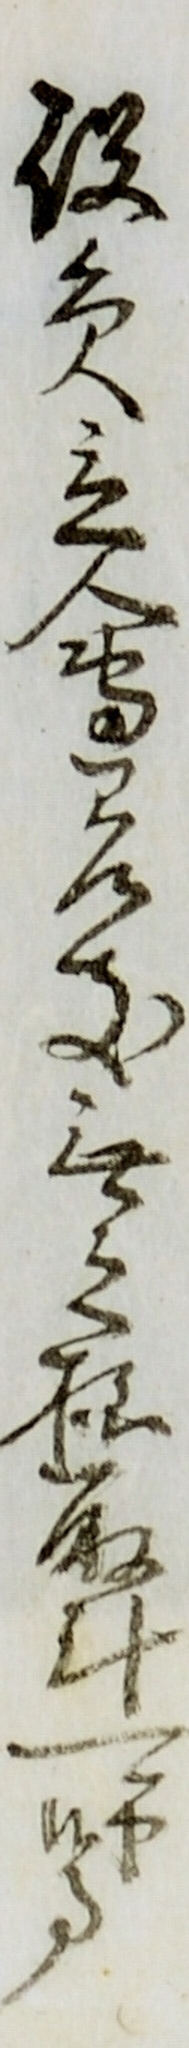役員立会差支無之様取計可申候事
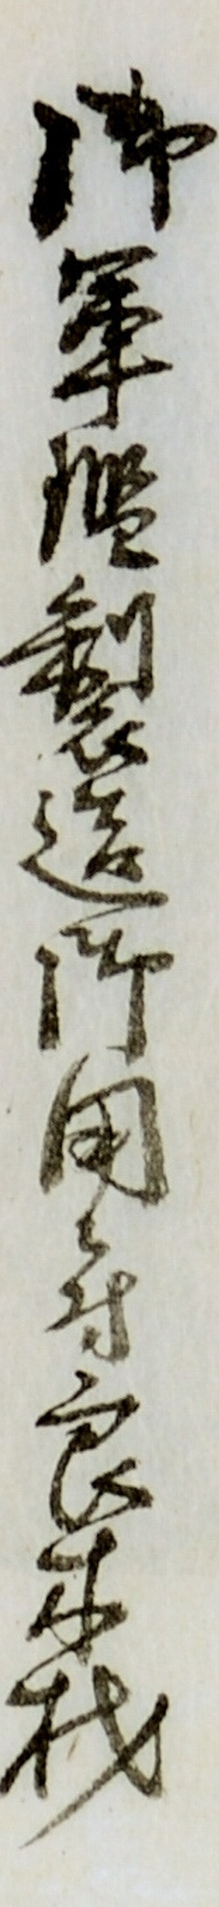御軍艦製造御用に付良木材
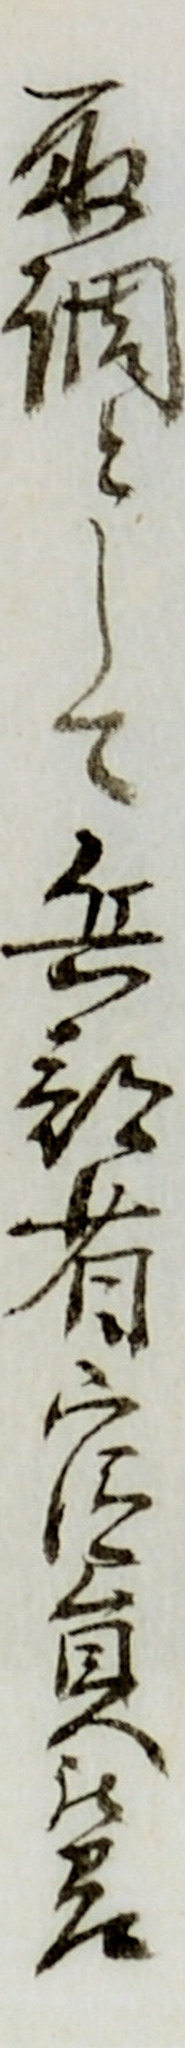取調として兵部省官員被差
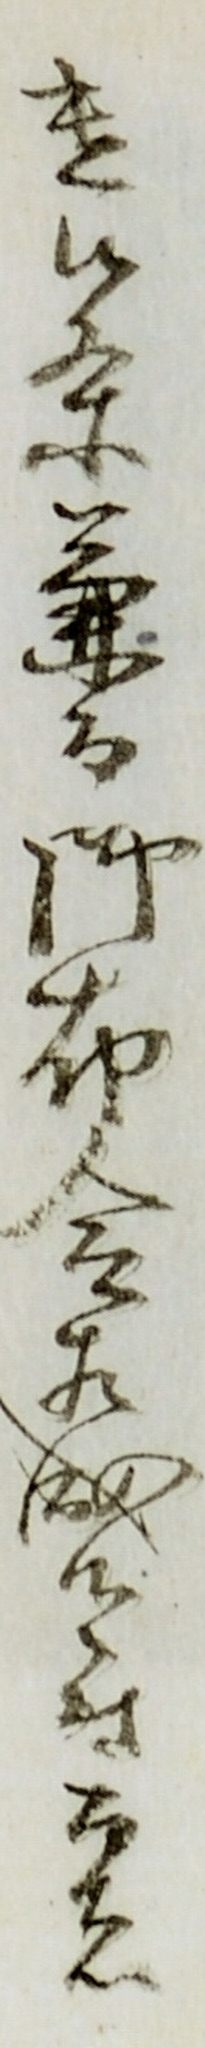遣候条兼て御布令相成候に付ては
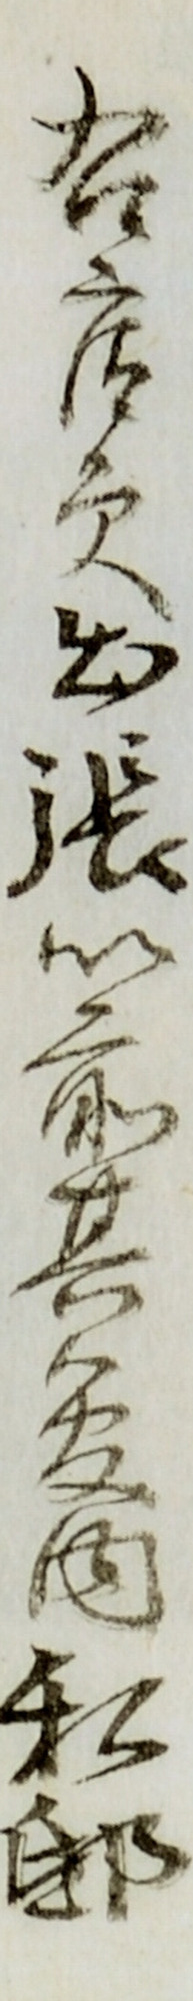右官員出張以前其管内私邸
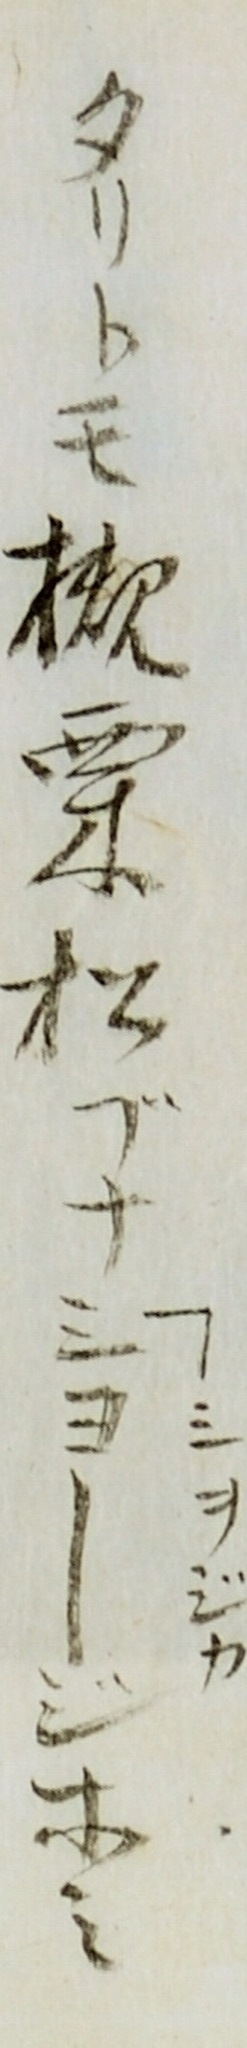タリトモ槻栗松ブナショージ等之
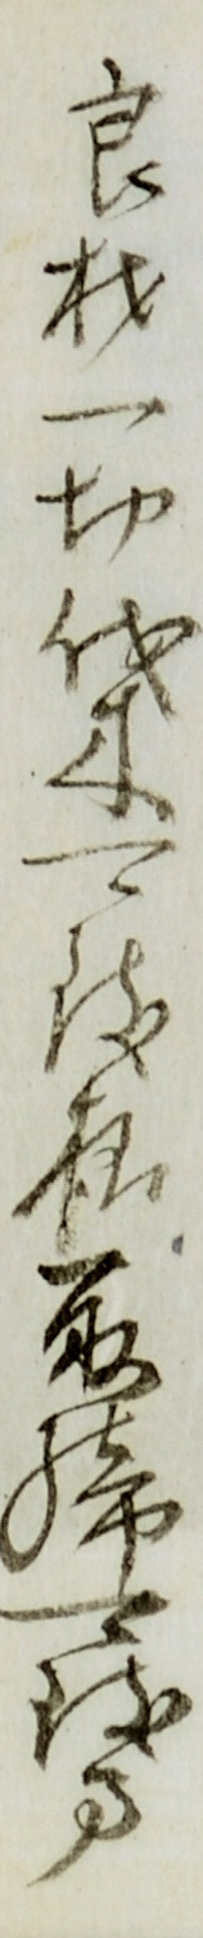良材一切伐木可致様取締可致事
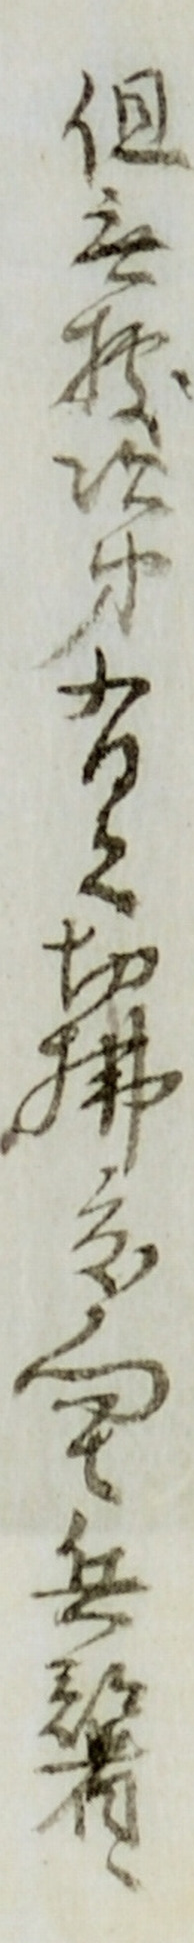但無拠次第有之切払度向は兵部省へ
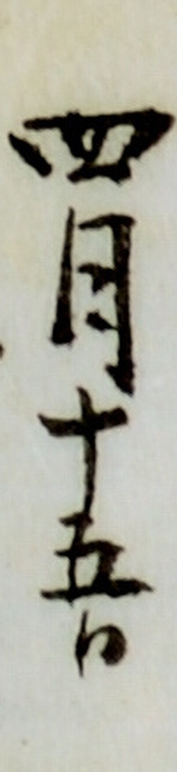四月十五日
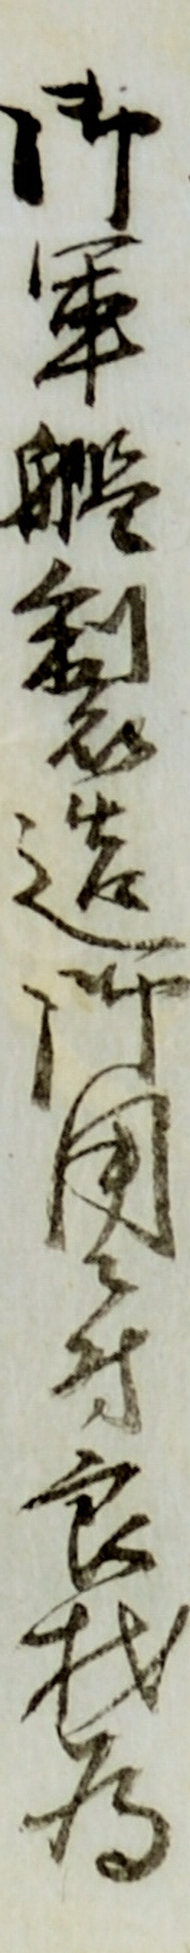御軍艦製造御用に付良材為
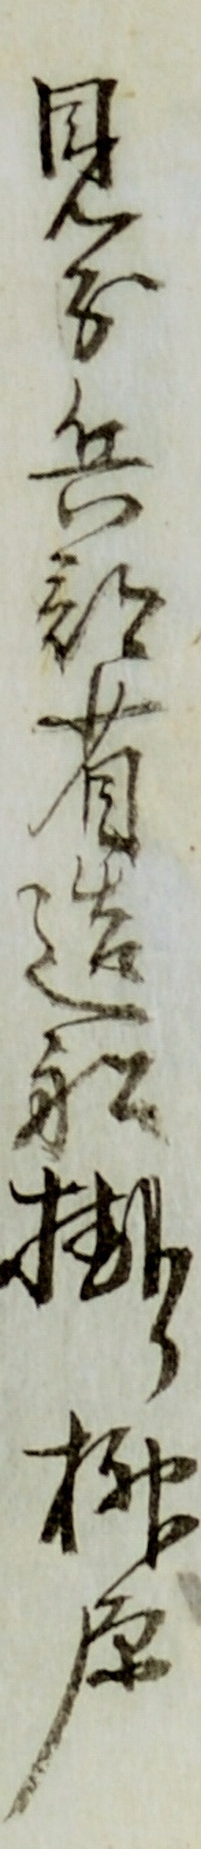見分兵部省造船掛り榊原

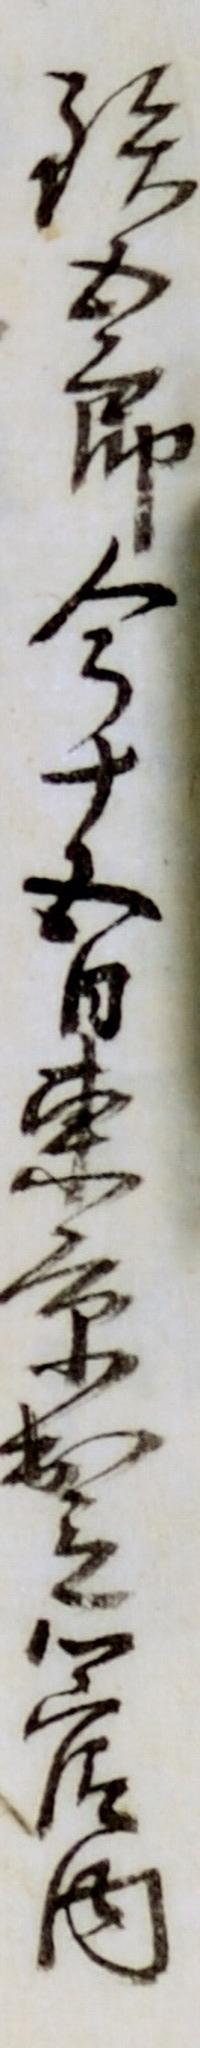鉄五郎今十五日東京出立管内
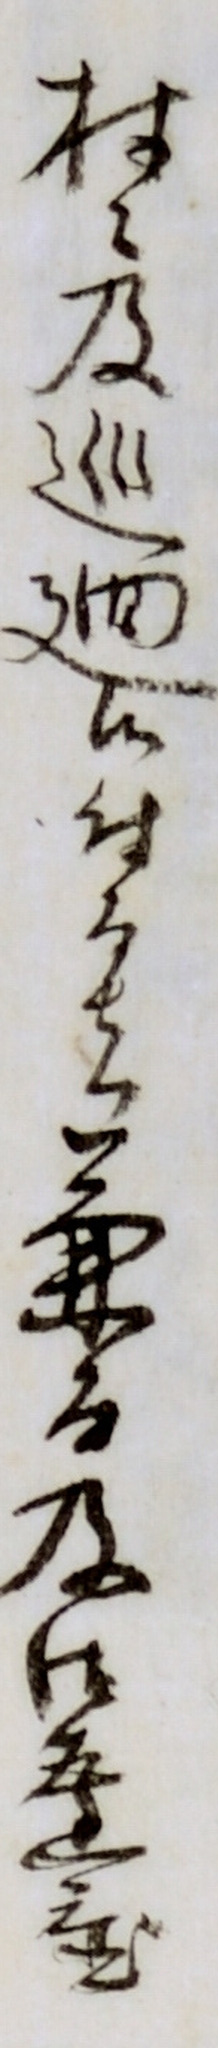村々及巡回候付ては兼て及御達置
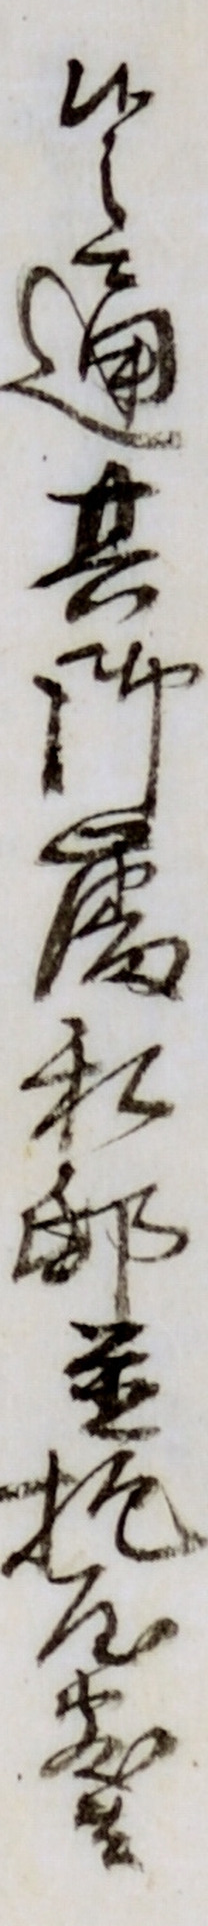候之通其御藩指定幷抱屋敷共
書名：山林方諸事御用留
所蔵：伊那市立高遠町図書館・合同会社AMANE
